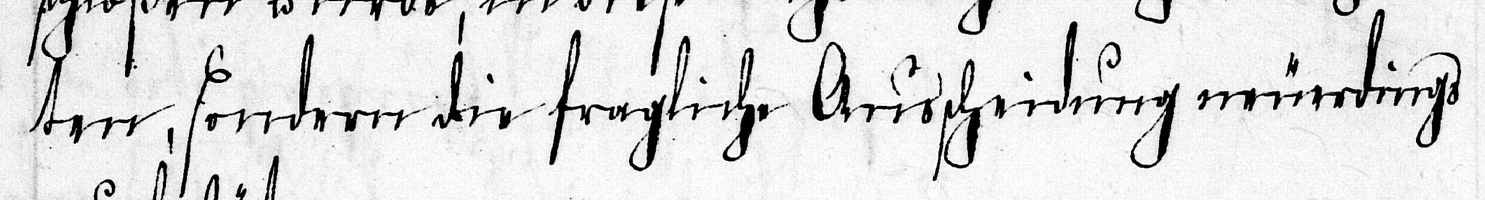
ten, sondern die fragliche Ausscheidung neuerdings
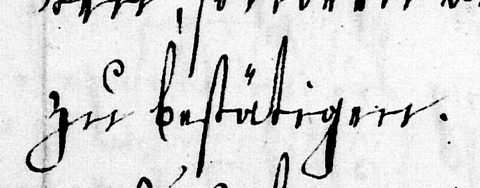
zu bestätigen.
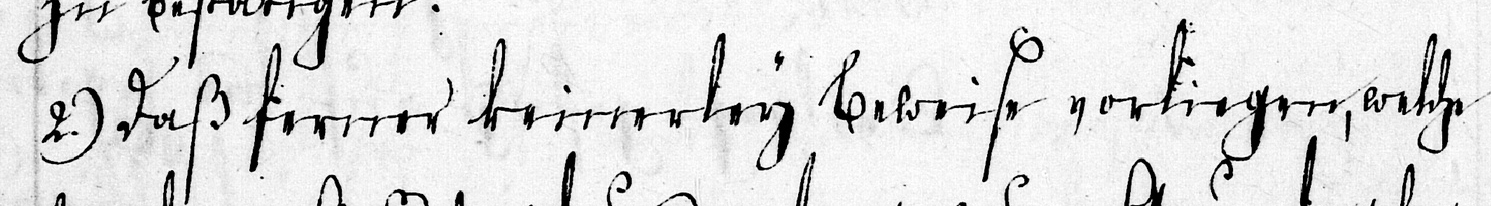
2.) Daß ferner keinerley Beweise vorliegen, welche
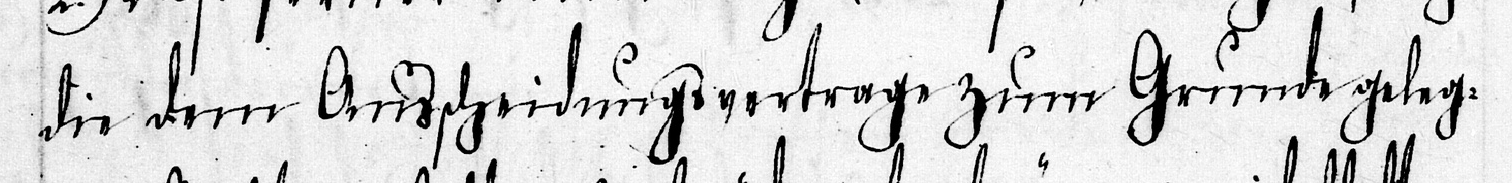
die dem Ausscheidungsvertrage zum Grunde geleg¬
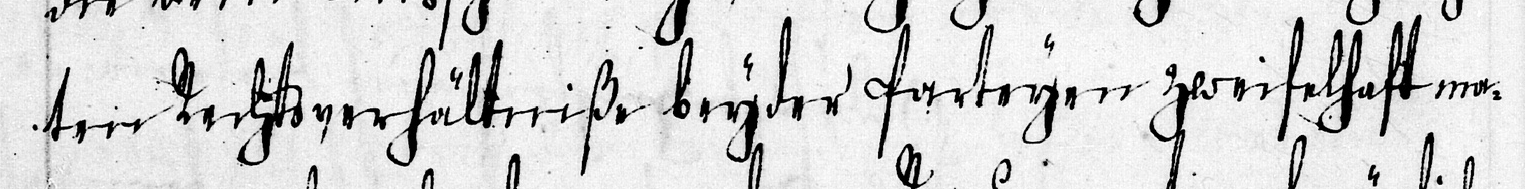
ten Rechtsverhältniße beyder Parteyen zweifelhaft ma¬
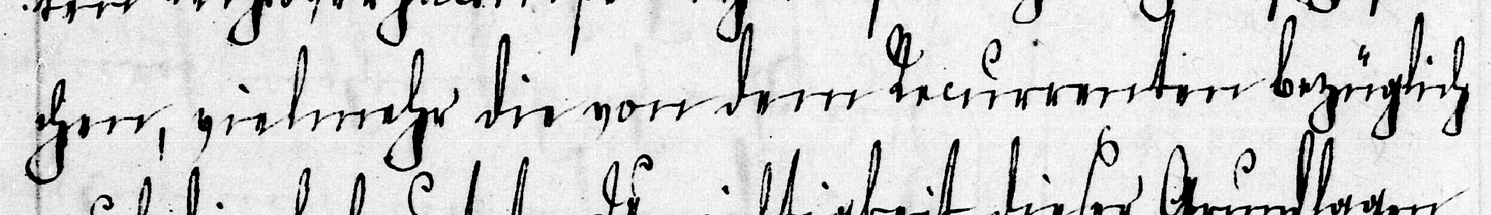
chen, vielmehr die von dem Recurrenten bezüglich
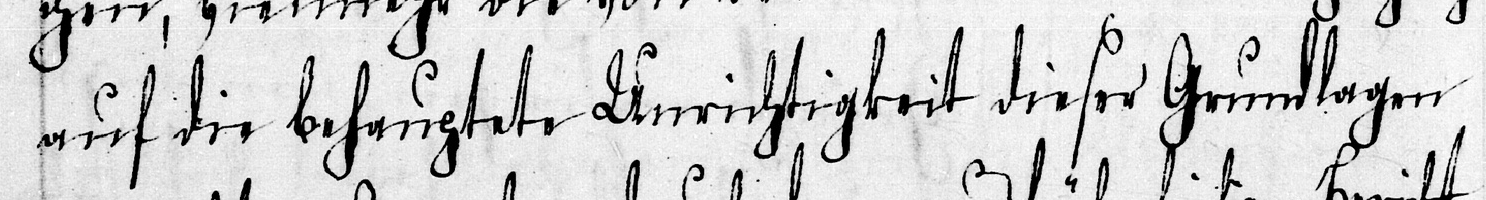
auf die behauptete Unrichtigkeit dieser Grundlagen
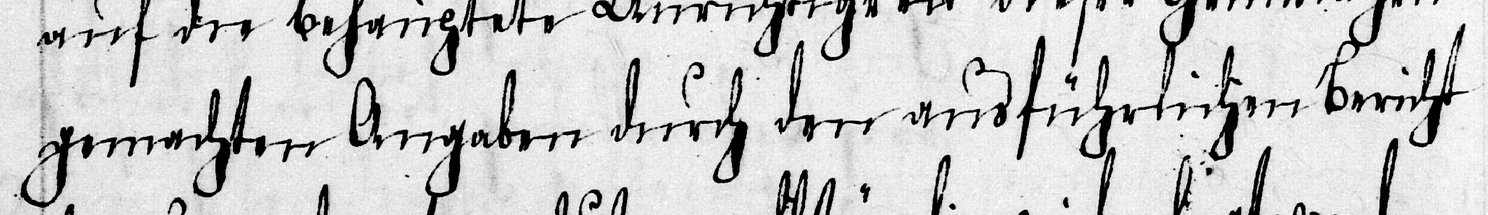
gemachten Angaben durch den ausführlichen Bericht
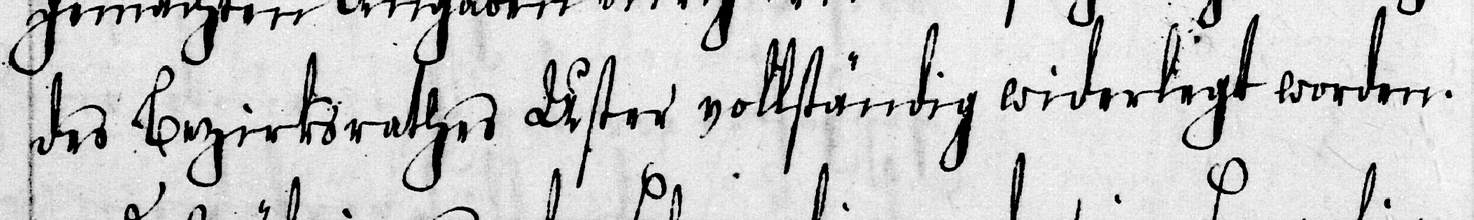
des Bezirksrathes Uster vollständig widerlegt worden.
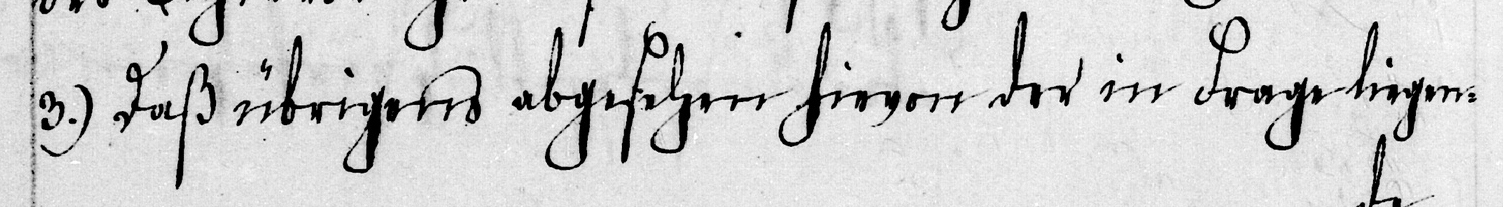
3.) Daß übrigens abgesehen hievon der in Frage liegen¬
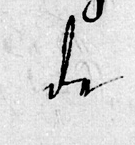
de
